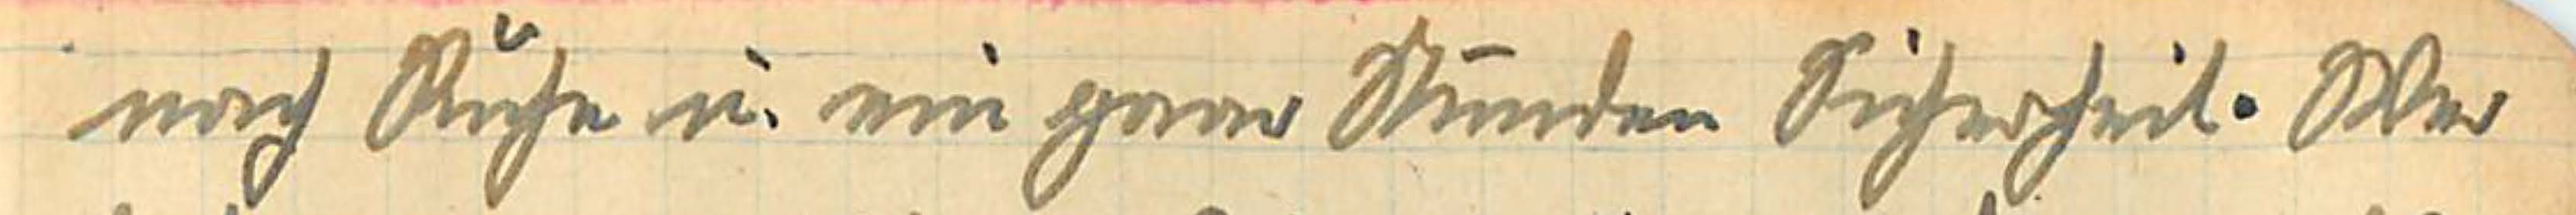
nach Ruhe u. ein paar Stunden Sicherheit. Wer
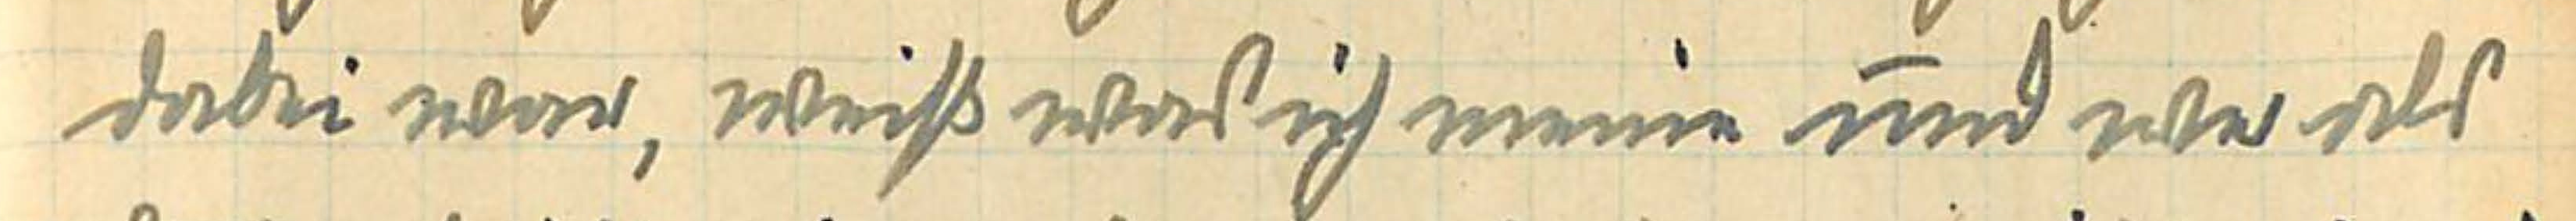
dabei war, weiß was ich meine und wer als
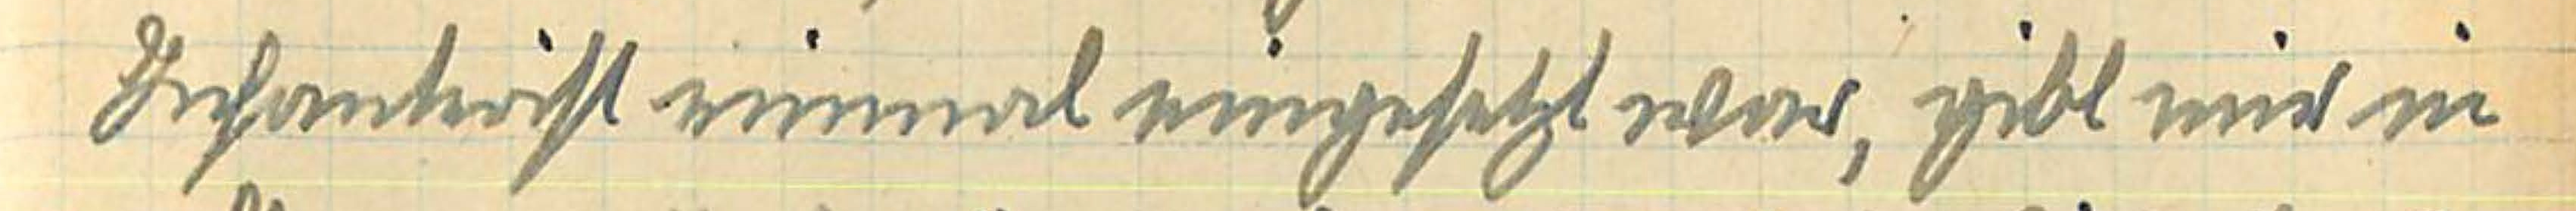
Infanterist einmal eingesetzt war, gibt mir in
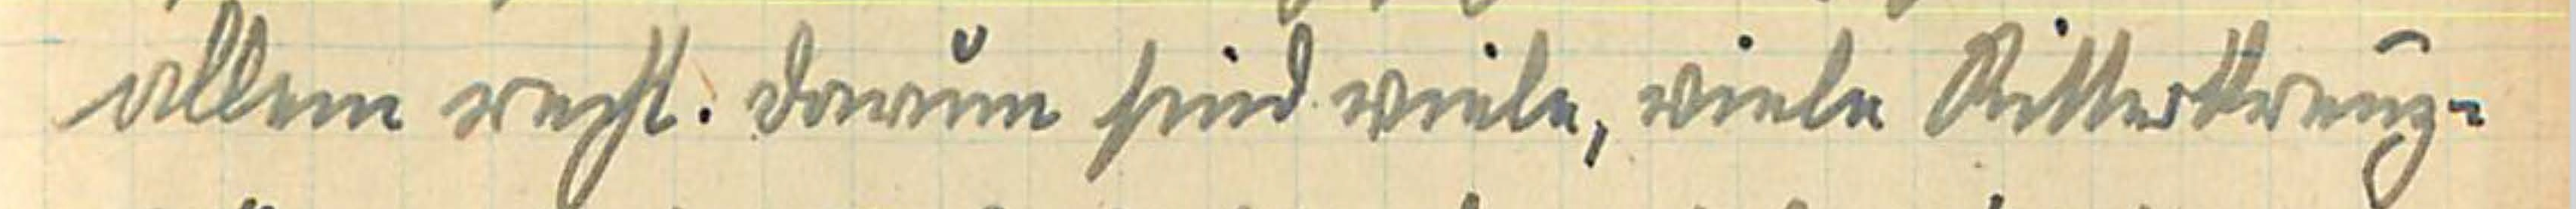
allem recht. Darum sind viele, viele Ritterkreuz-
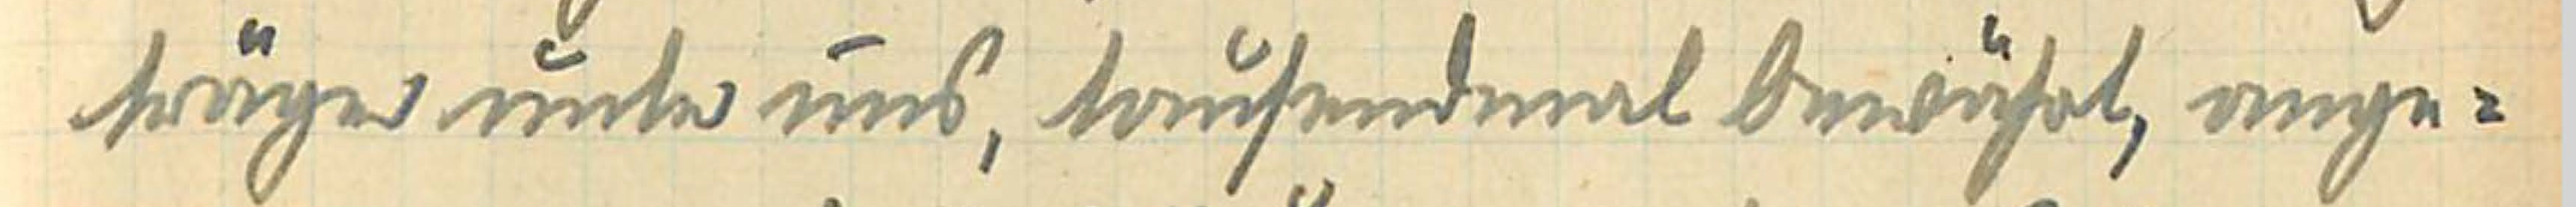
träger unter uns, tausendmal bewährt, ange-
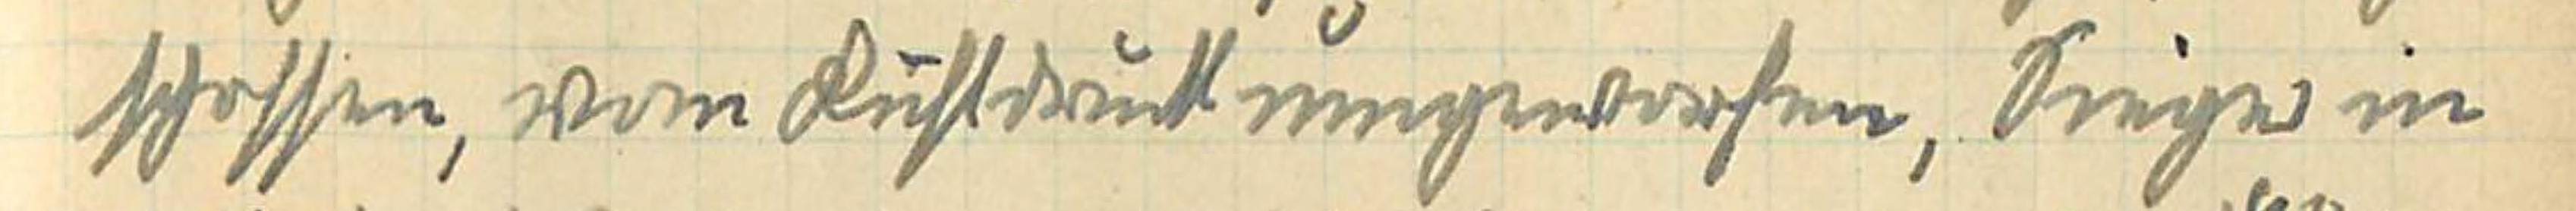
schossen, vom Luftdruck umgeworfen, Sieger in
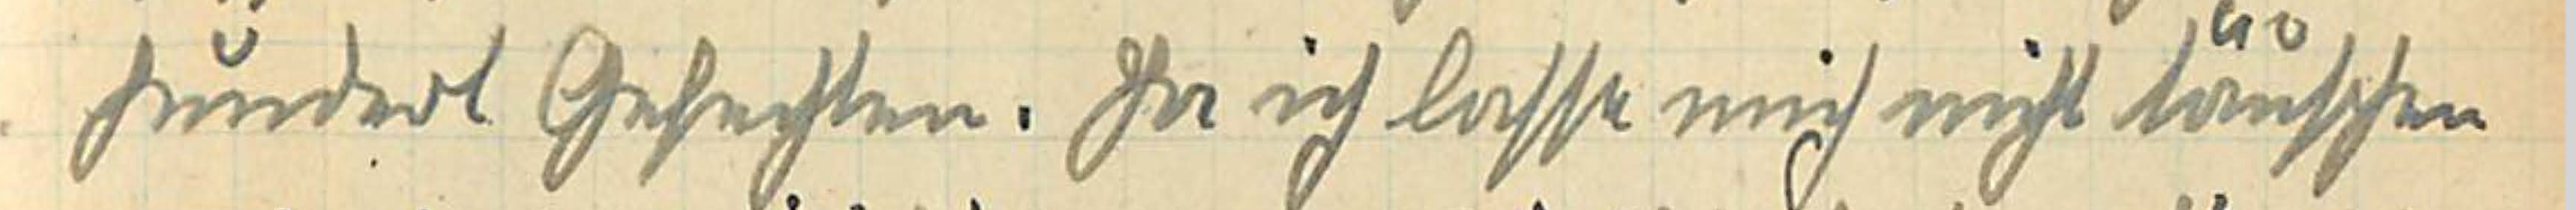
hundert Gefechten. Ja ich lasse mich nicht täuschen
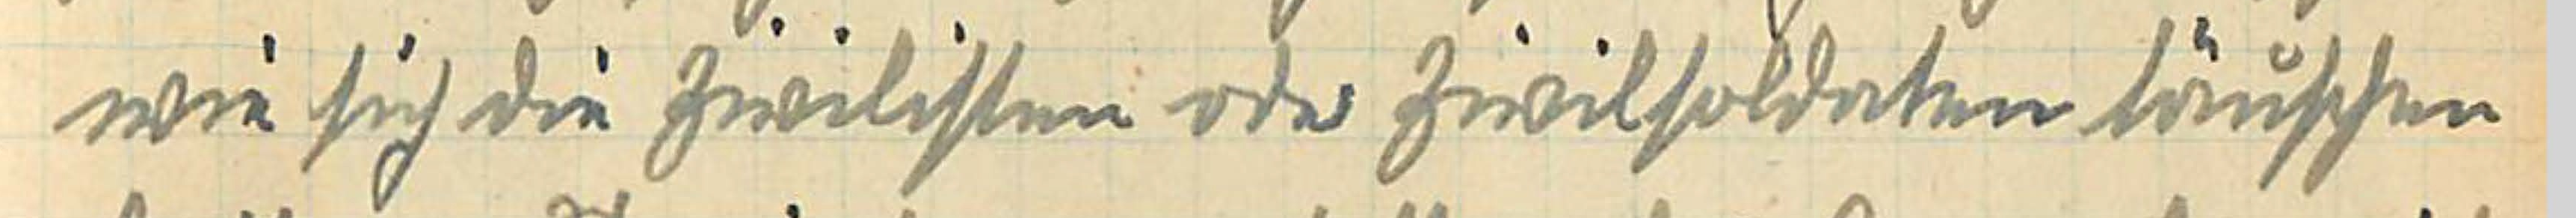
wie sich die Zivilisten oder Zivilsoldaten täuschen
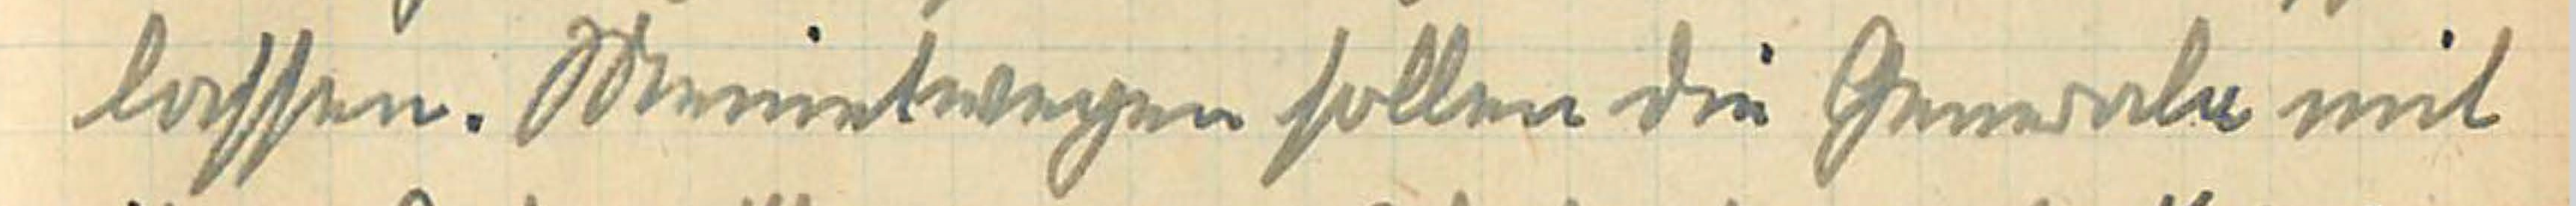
lassen. Meinetwegen sollen die Generale mit
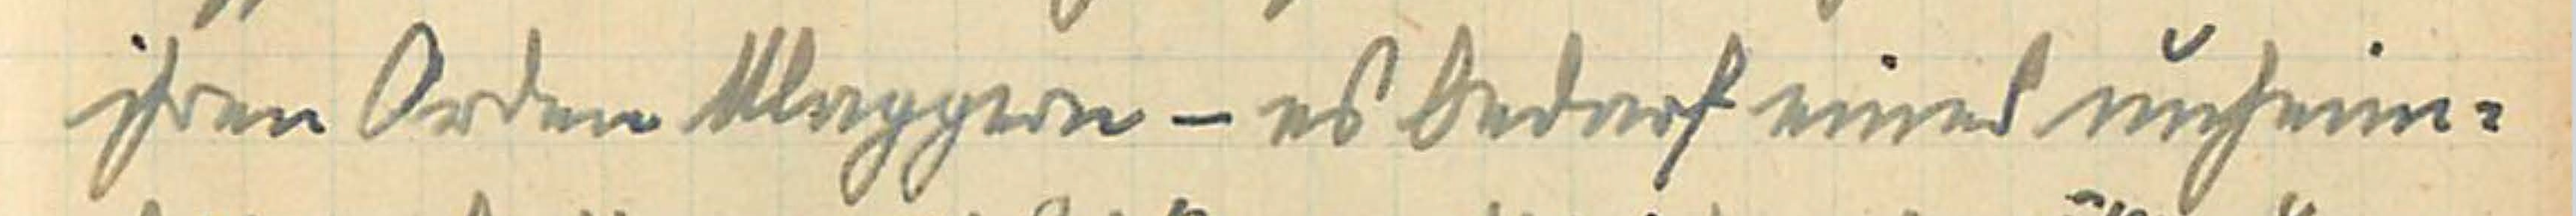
ihren Orden klappern – es bedarf eines unheim-
